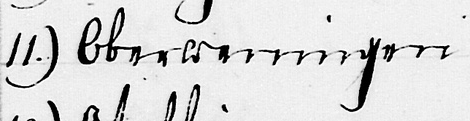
11.) Oberweningen
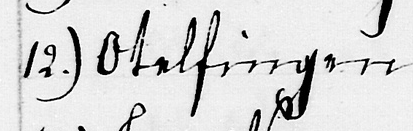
12.) Otelfingen
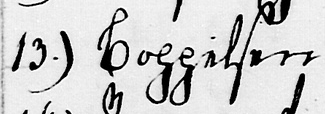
13.) Boppelsen
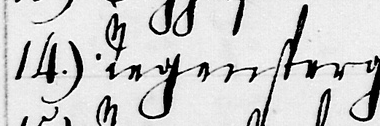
14.) Regensperg
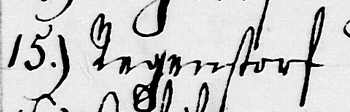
15.) Regenstorf
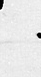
.
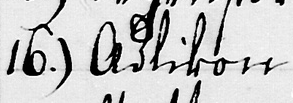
16.) Adlikon
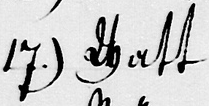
17.) Watt
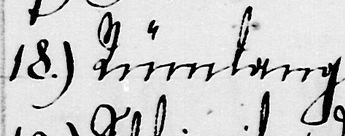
18.) Rümlang
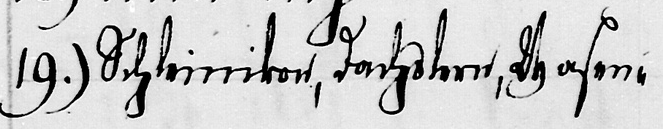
19.) Schleinikon, Dachslern, Wasen
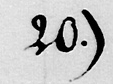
26.
